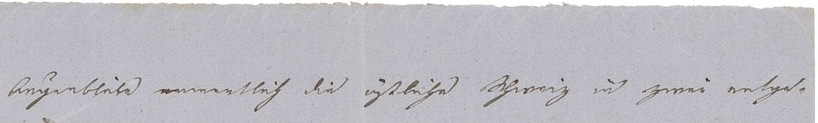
Augenblicke namentlich die
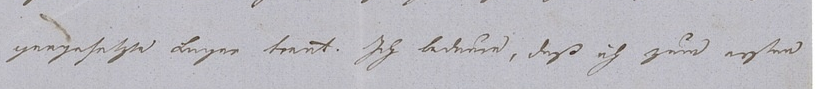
gengesetzte Lager trennt. Ich bedaure, daß ich zum ersten
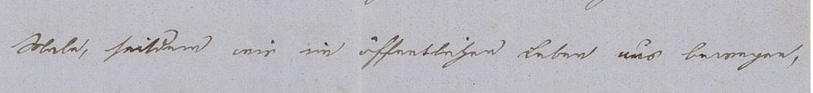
Male, seitdem wir im öffentlichen Leben uns bewegen,
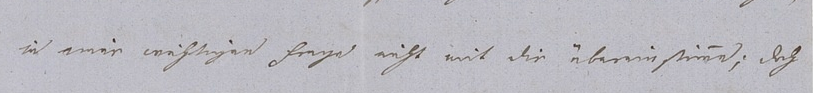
in einer wichtigen Frage nicht mit Dir übereinstimme; doch
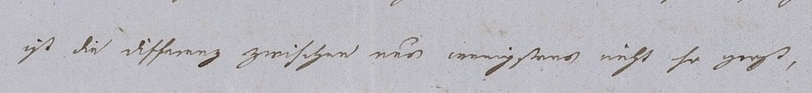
ist die Differenz zwischen uns wenigstens nicht so groß,
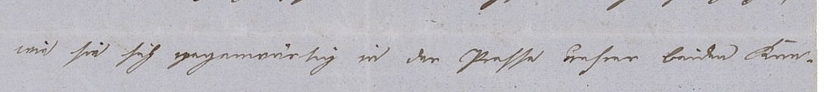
wie sie sich gegenwärtig in der Presse unsrer beiden Kan-
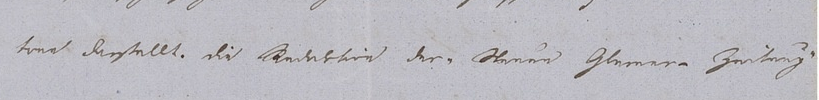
tone darstellt. Die Redaktion der «Neuen Glarner Zeitung»
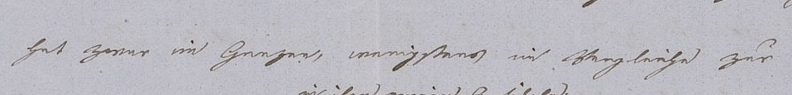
hat zwar im Ganzen, wenigstens im Vergleiche zur
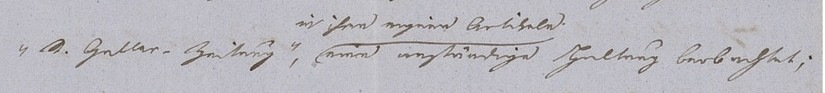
«St. Gallen-Zeitung» in ihren eignen Artikeln eine anständige Haltung beobachtet;
